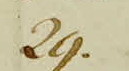29.
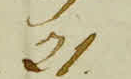21.
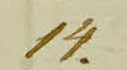14.
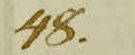48.
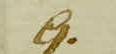9.
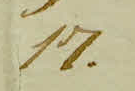17.
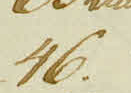46.
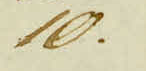10.
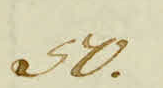50.
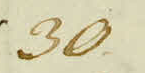30
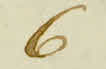6
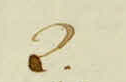2.
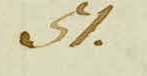51.
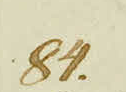84.
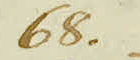68.
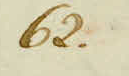62.
